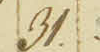31.
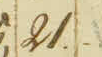21.
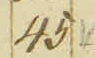45
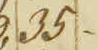35
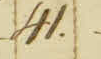41.
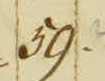59
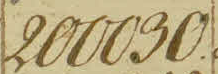200030.
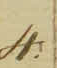4.
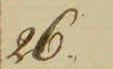26.
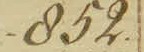852.
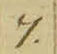7.
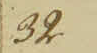32
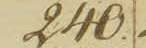240.
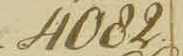4082.
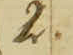2
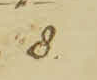8.
